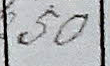50
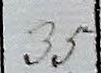35
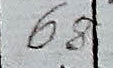68
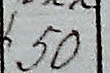50
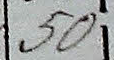50
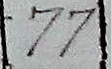77
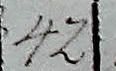42
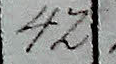42
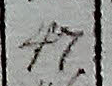47
